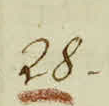28
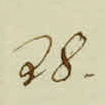28
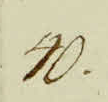40
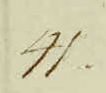41
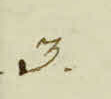3.
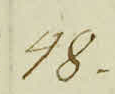48
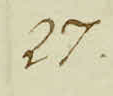27
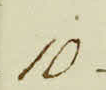10
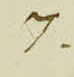7
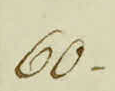60
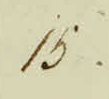15
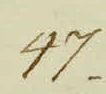47
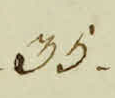35
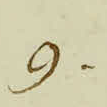9
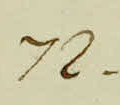72
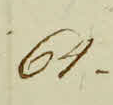64
